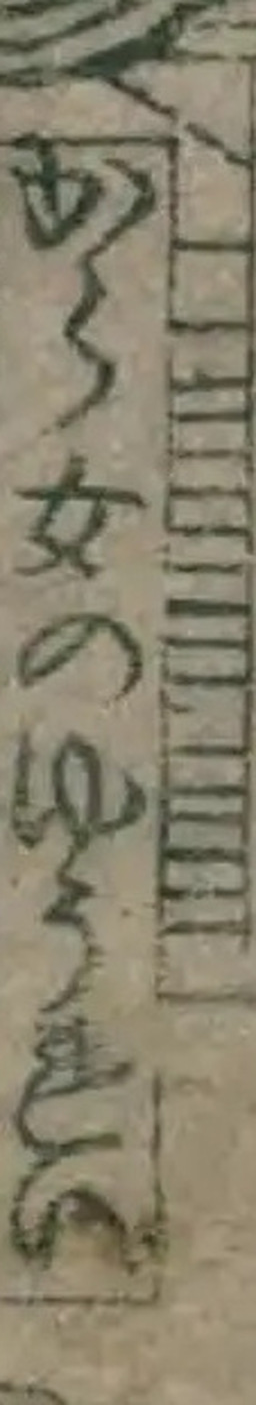から女のゆうれい

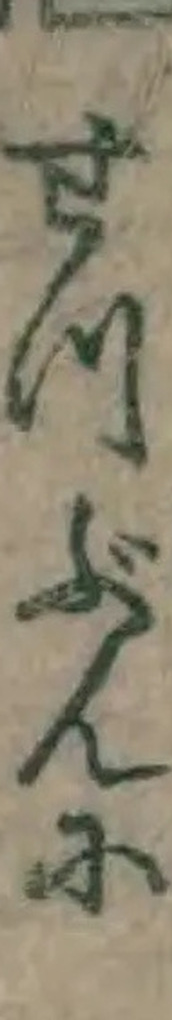せつぶんに
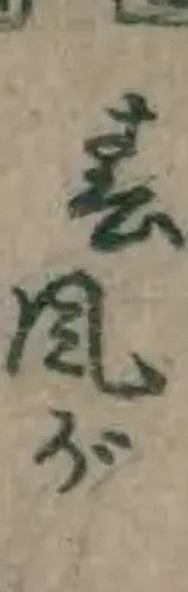春風が
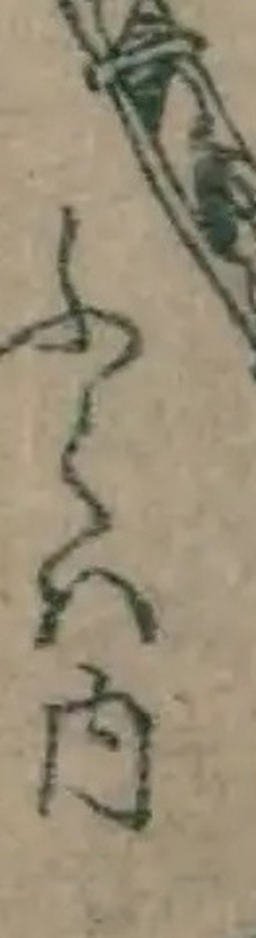ふくは内
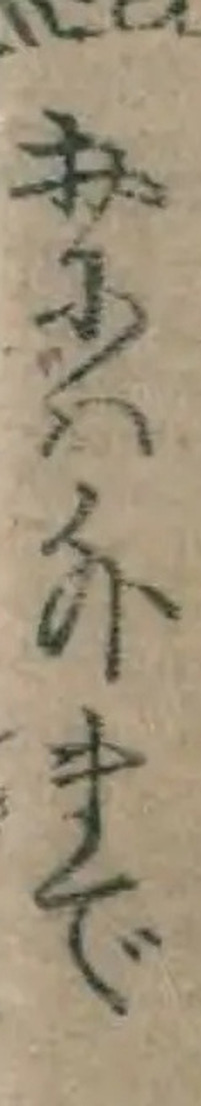おには外まで
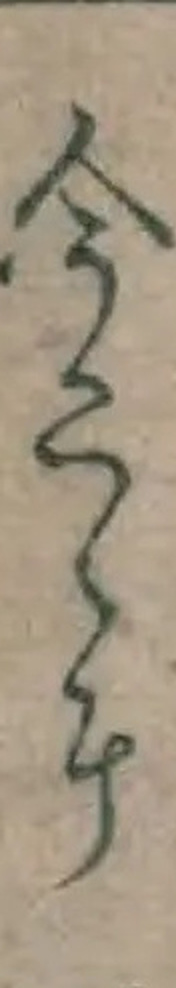今こゝに
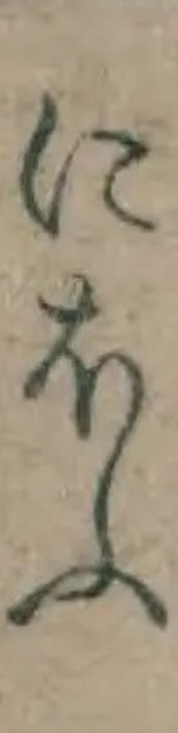にほふ
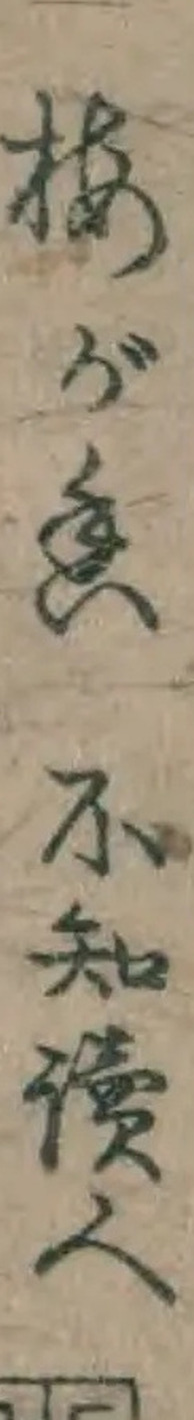梅が香不知讀人
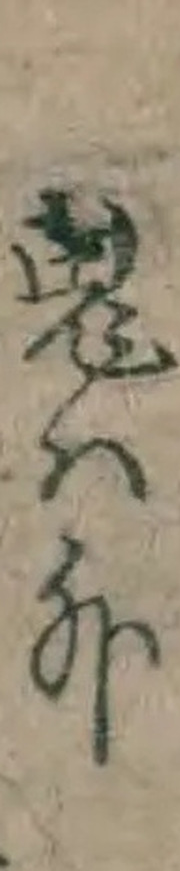鬼は外
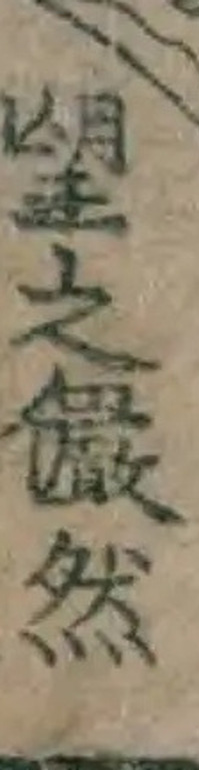望之儼然
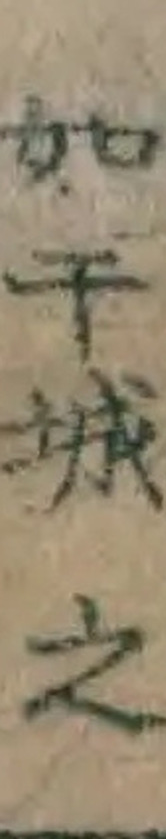如干城之
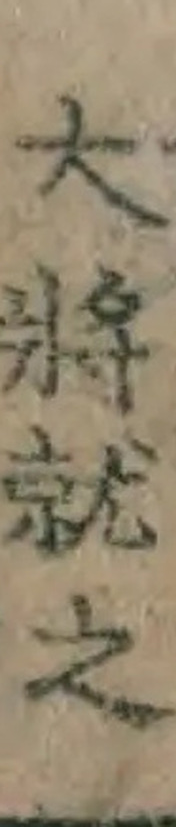大將就之
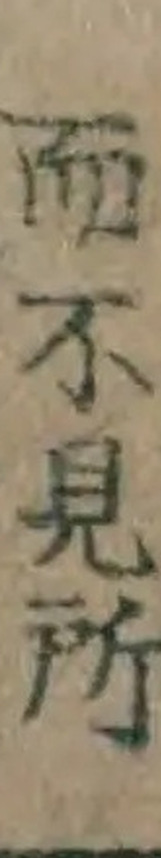而不見所
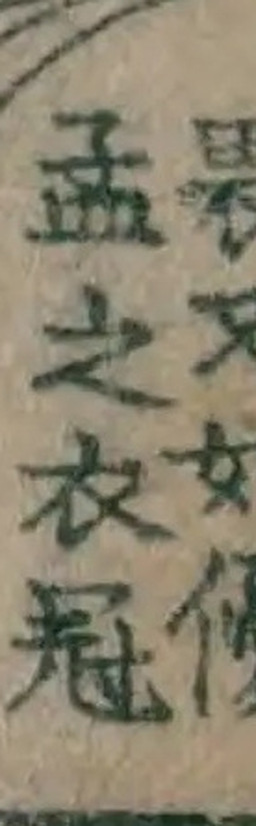孟之衣冠

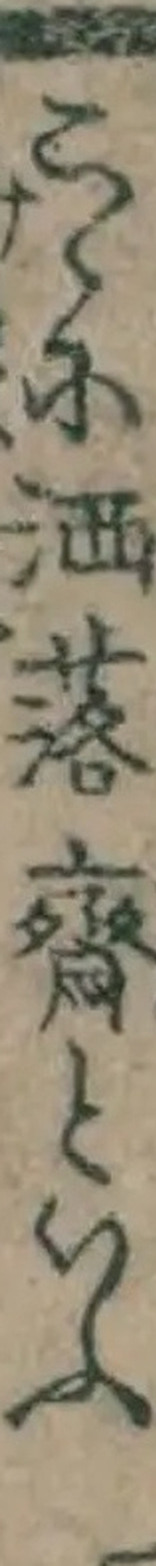ここに洒落齋といふ
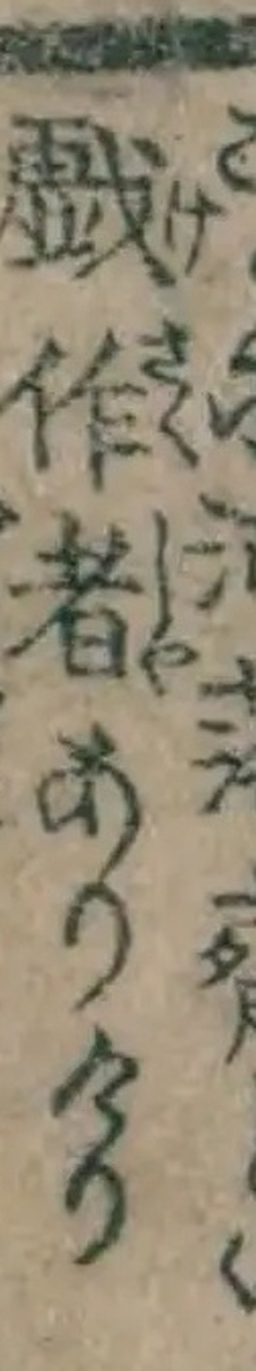戯作者ありけり
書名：大時代唐土化物 3巻
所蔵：国立国会図書館 National Diet Library, JAPAN
